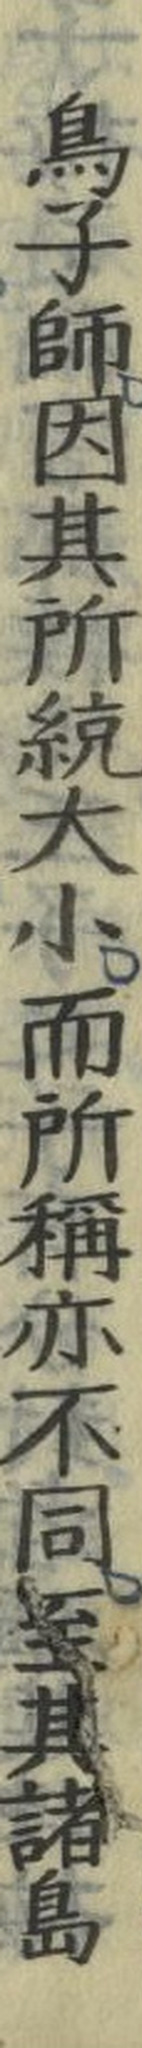鳥子師。因其所綂大小。而所稱亦不同。至其諸島
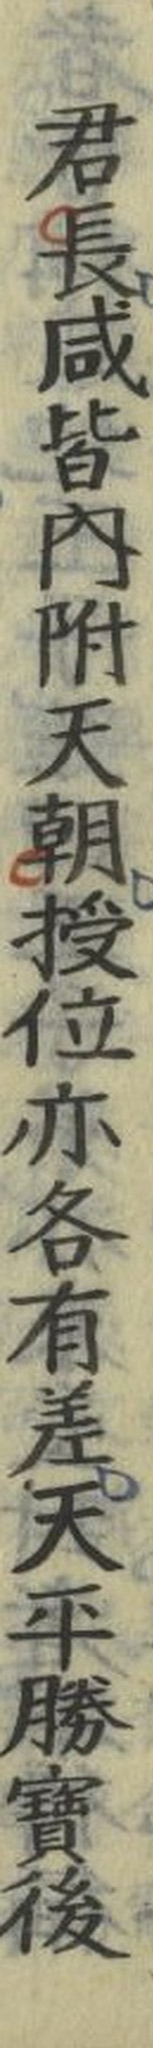君長。咸皆内附天朝。授位亦各有差。天平勝寶後
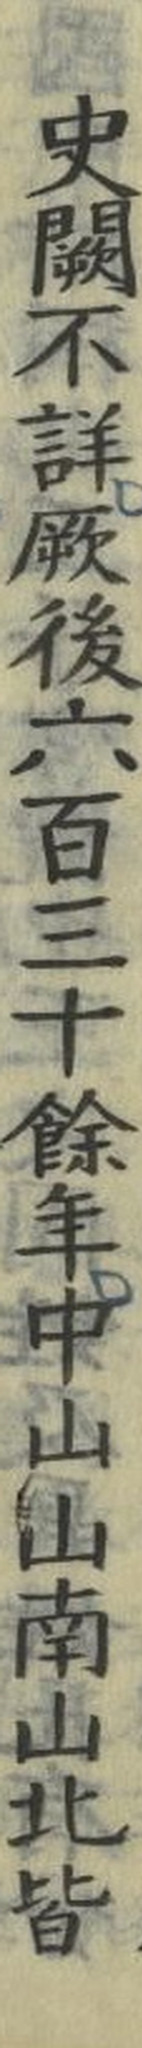史闕不詳。厥後六百三十餘年。中山山南山北皆
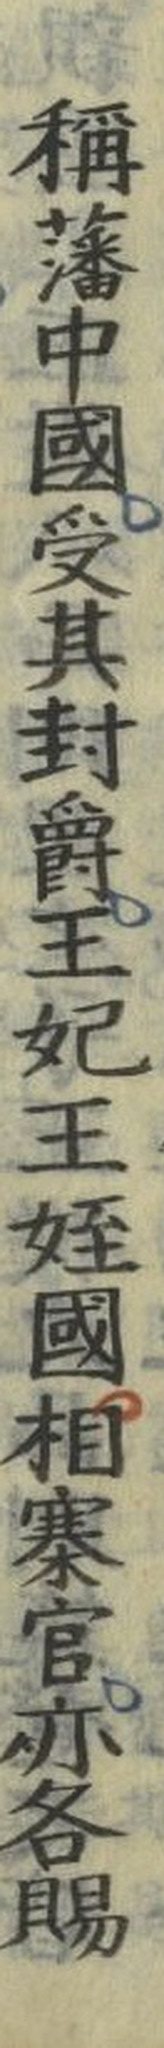稱藩中國。受其封爵。王妃王姪國相寨官。亦各賜
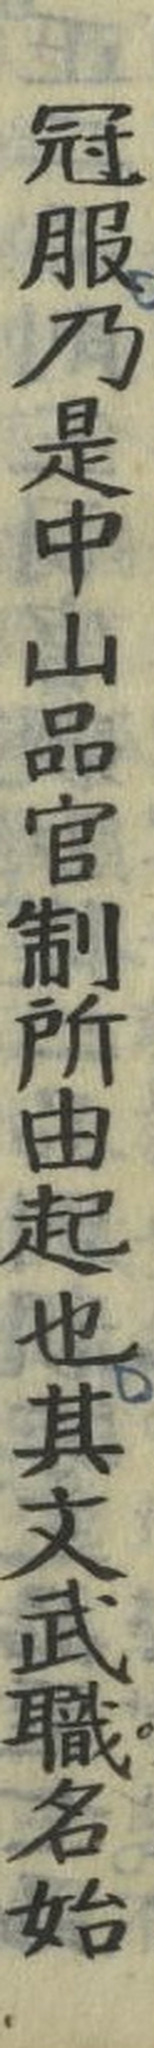冠服。乃是中山品官制所由起也。其文武職名始
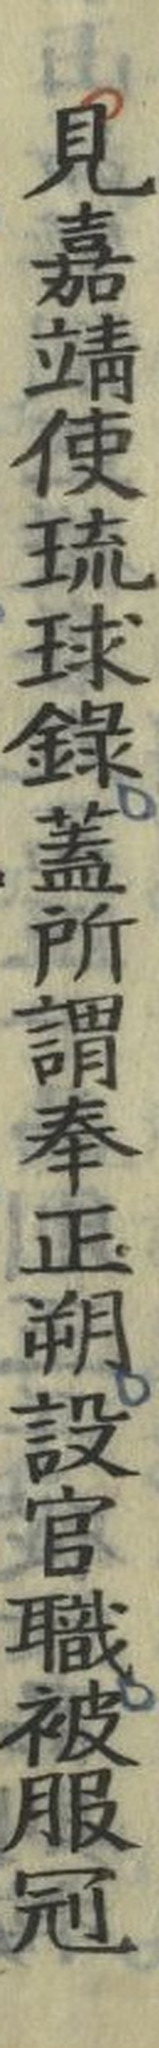見嘉靖使琉球錄。蓋所謂奉正朔。設官職。被服冠
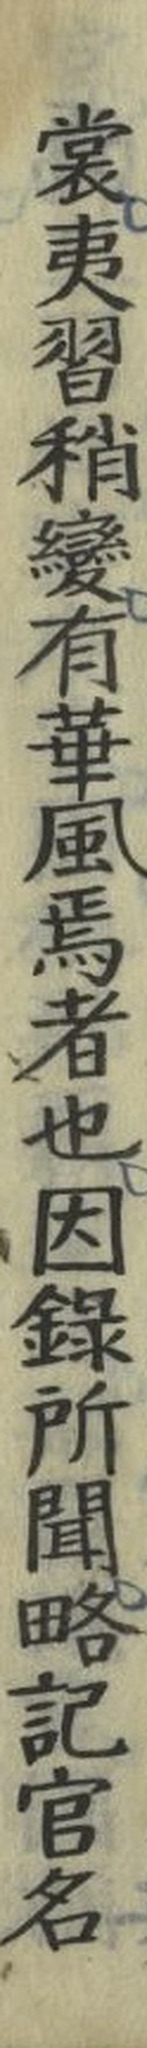裳。夷習稍變。有華風焉者也。因録所聞。略記官名

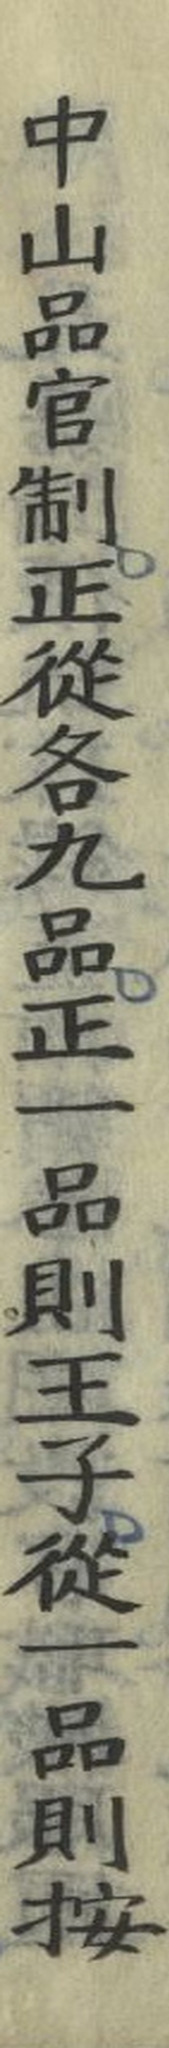中山品官制。正從各九品。正一品則王子。從一品則按
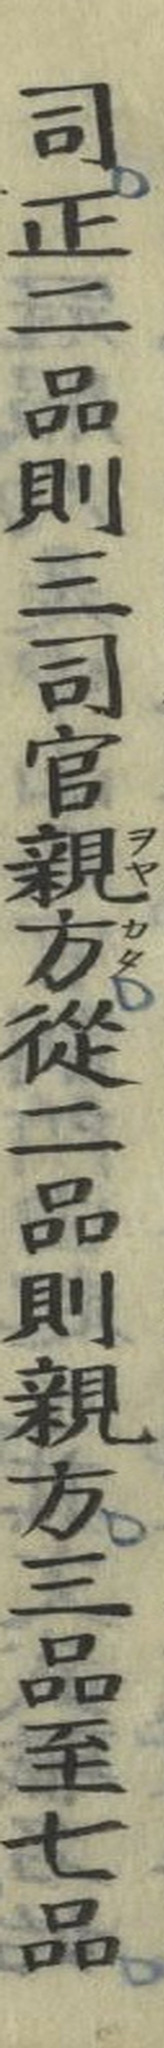司。正二品則三司官親方。從二品則親方。三品至七品。
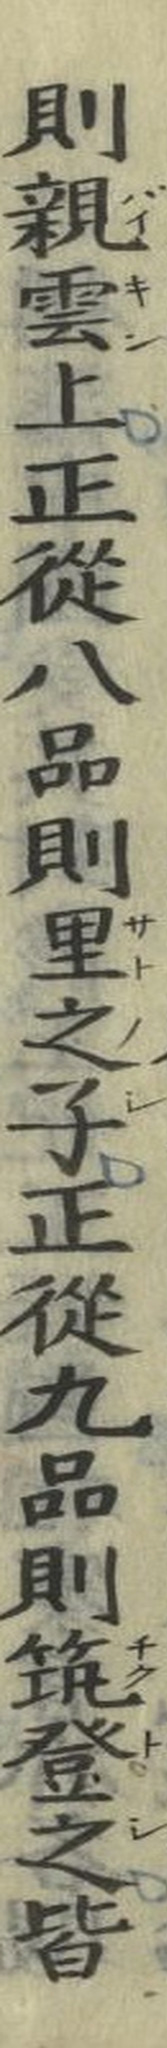則親雲上。正從八品則里之子。正從九品則筑登之。皆
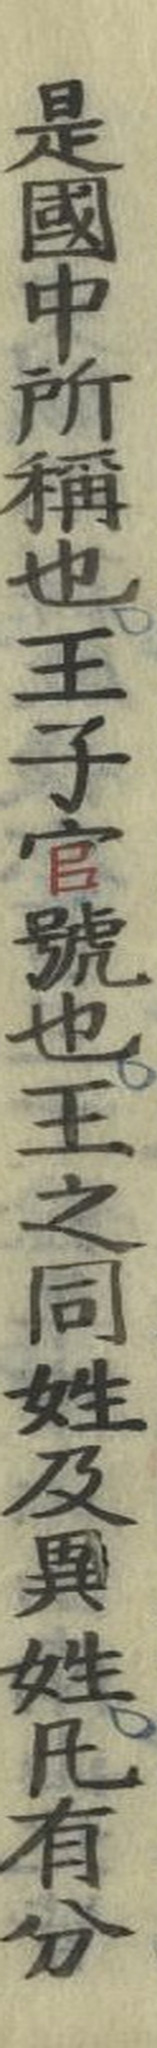是國中所稱也。王子官號也。王之同姓及異姓。凡有分
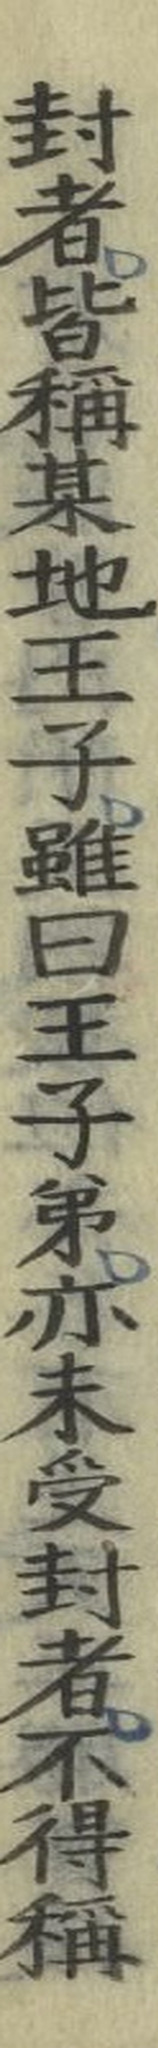封者。皆稱某地王子。雖曰王子弟。亦未受封者。不得稱
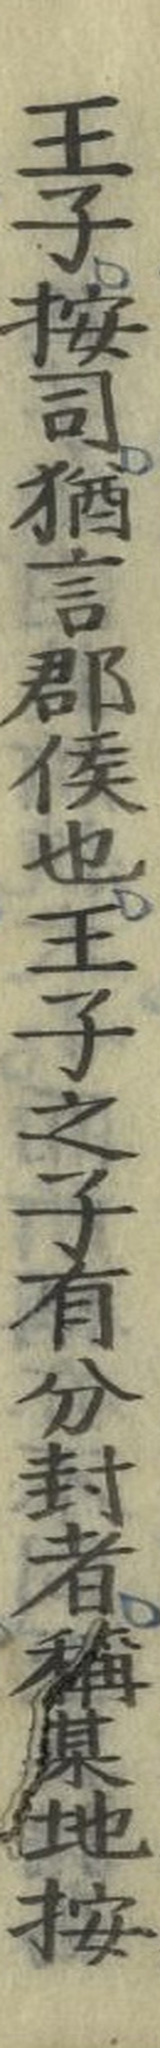王子。按司。猶言郡侯也。王子之子有分封者。稱某地按
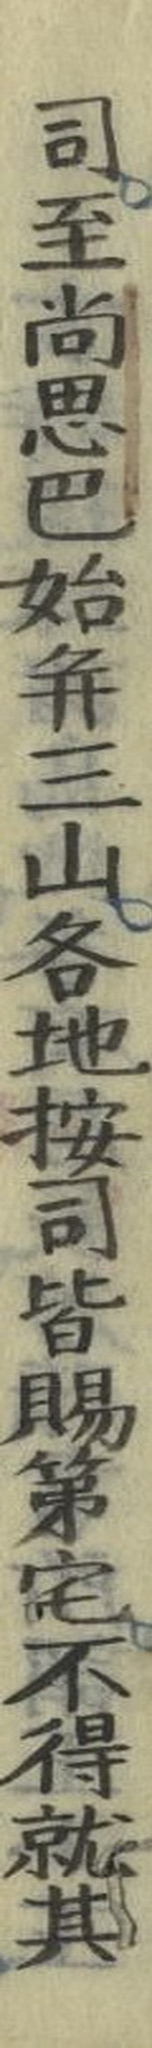司。至尚思巴始并三山。各地按司皆賜第宅。不得就其
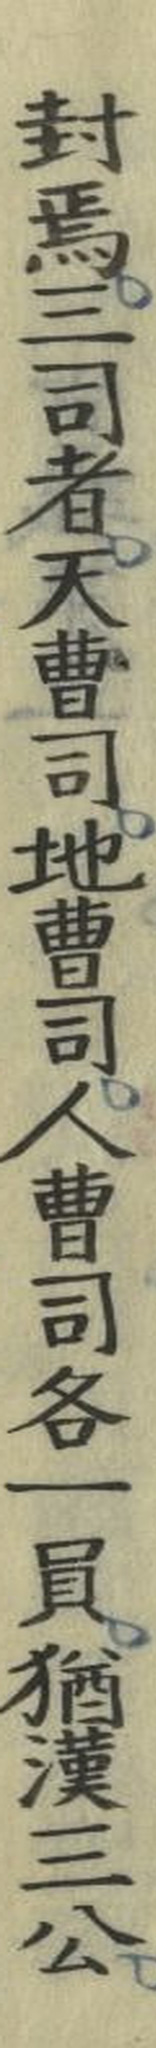封焉。三司者。天曹司。地曹司。人曹司各一員。猶漢三公。
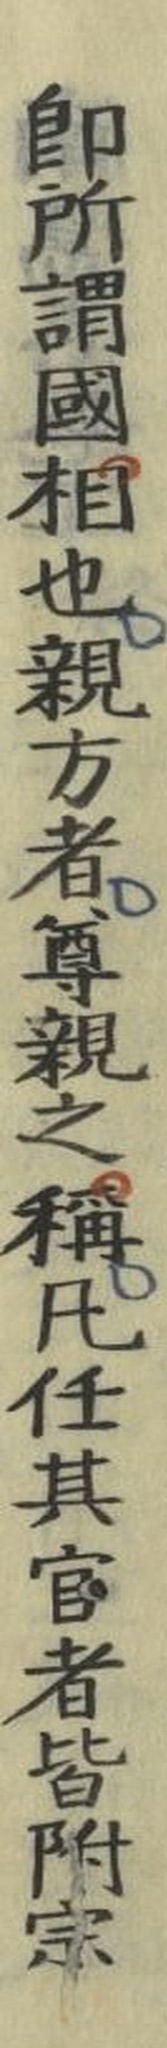卽所謂國相也。親方者。尊親之稱。凡任其官者皆附宗
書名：南島志
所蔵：University of the Ryukyus Library
